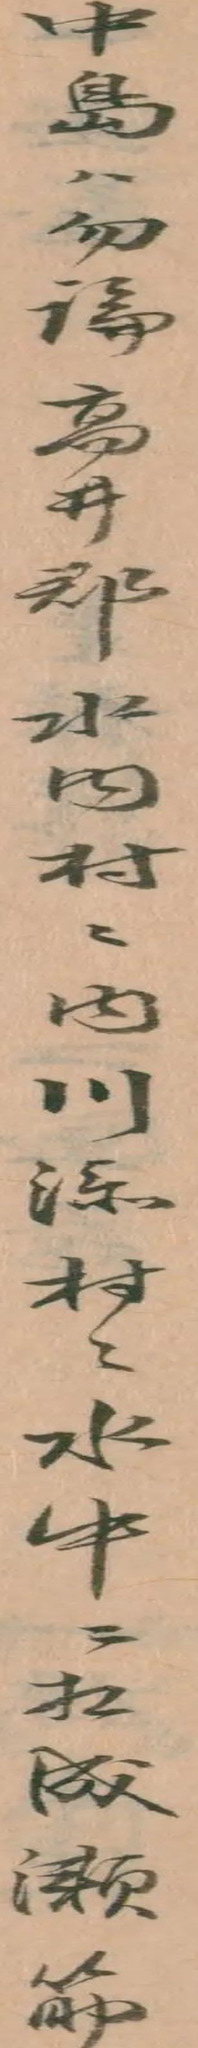中島ハ勿論高井郡水内村々内川添村々水中ニ相成瀬筋
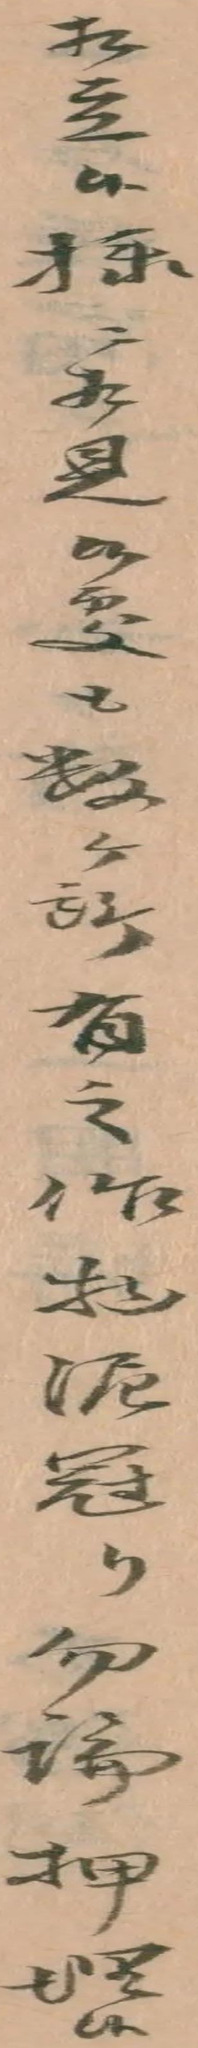相立候様二相見候処も数ヶ所有之作物泥冠り勿論押埋候
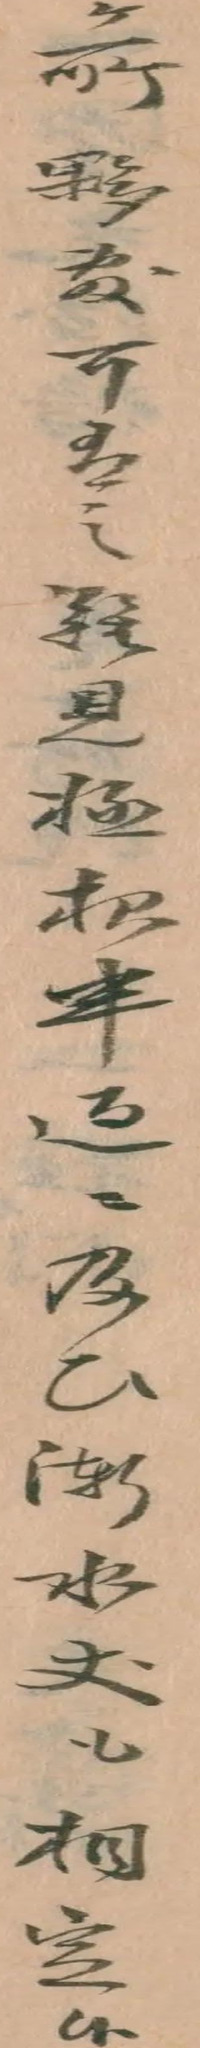ヶ所夥敷可有之難見極夜半過ニ及ひ漸水丈も相定候
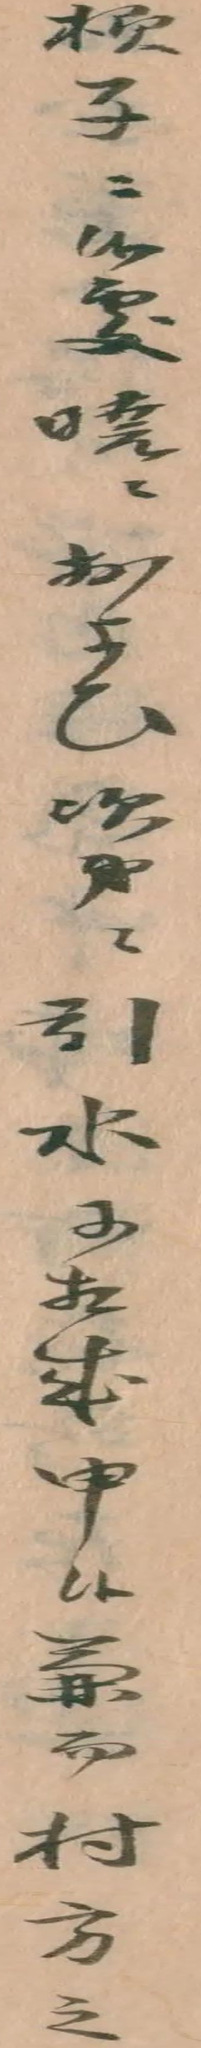様子ニ候処暁ニおよひ次第ニ引水ニ相成申候兼而村方之
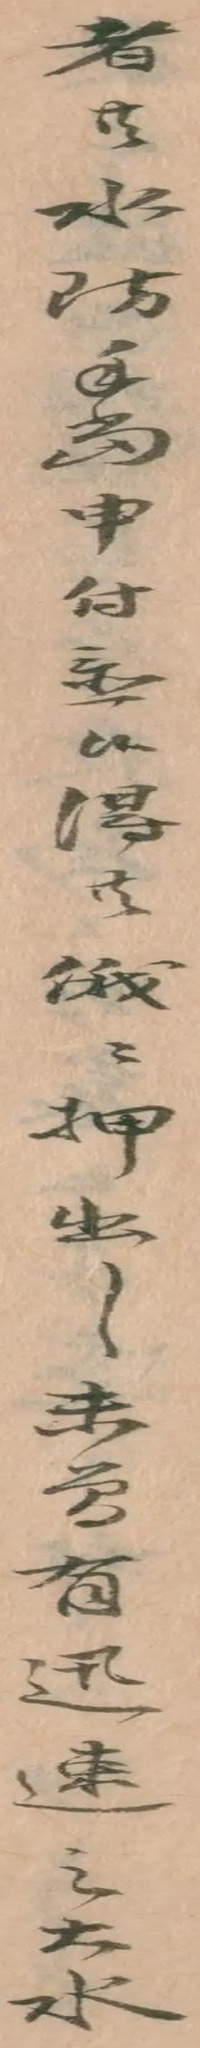者共水防手当申付置候得共俄二押出し未曾有迅速之大水
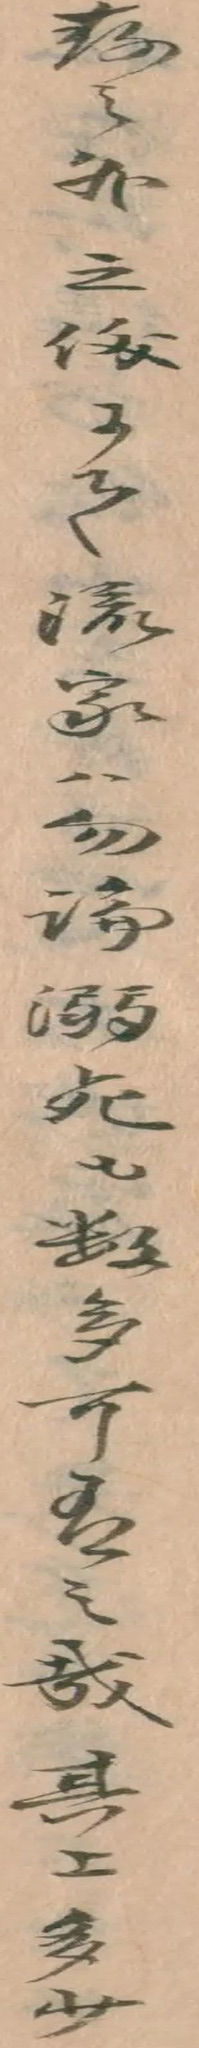存之外之儀にて流家ハ勿論溺死も数多有之哉其上多少
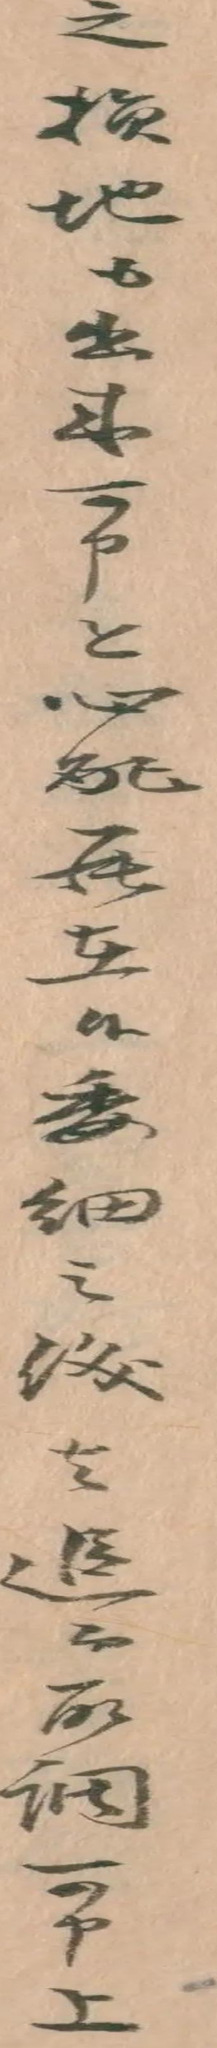之損耗も出来可申と心配罷在候委細之儀ハ追而取調可申上
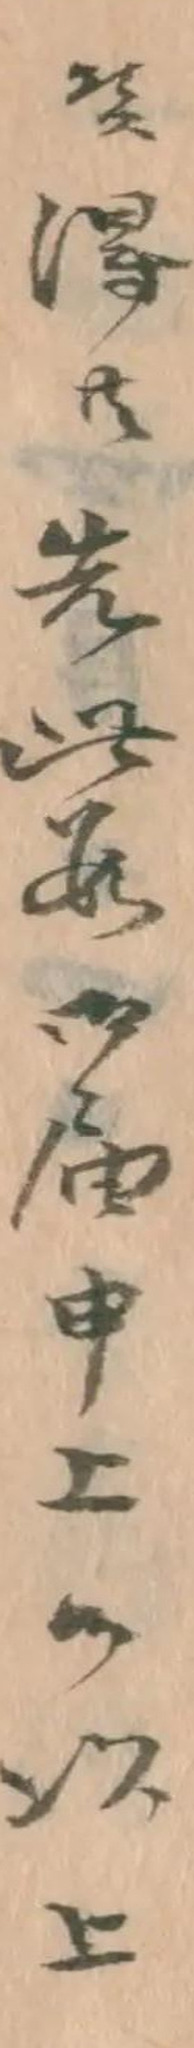候得共先此段御届申上候以上

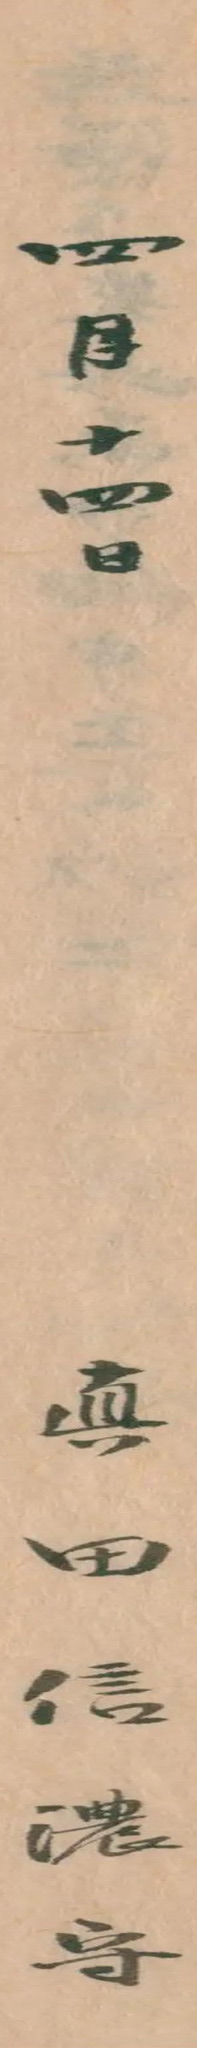四月十四日真田信濃守
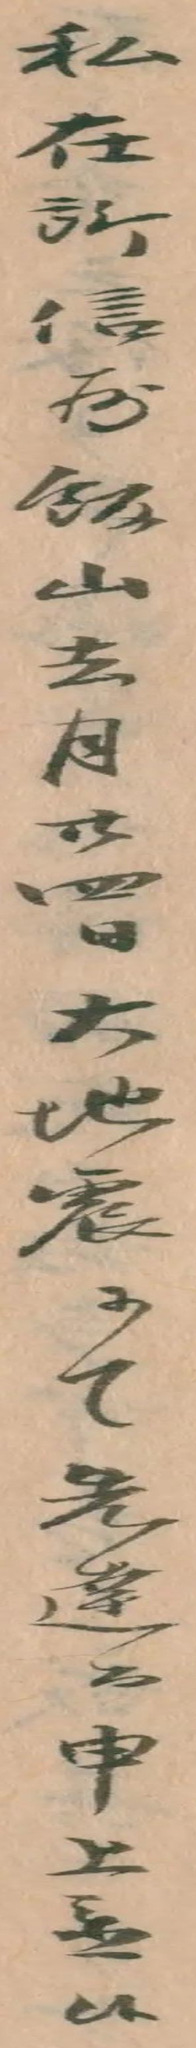私在所信州飯山去月廿四日大地震にて先達而申上置候
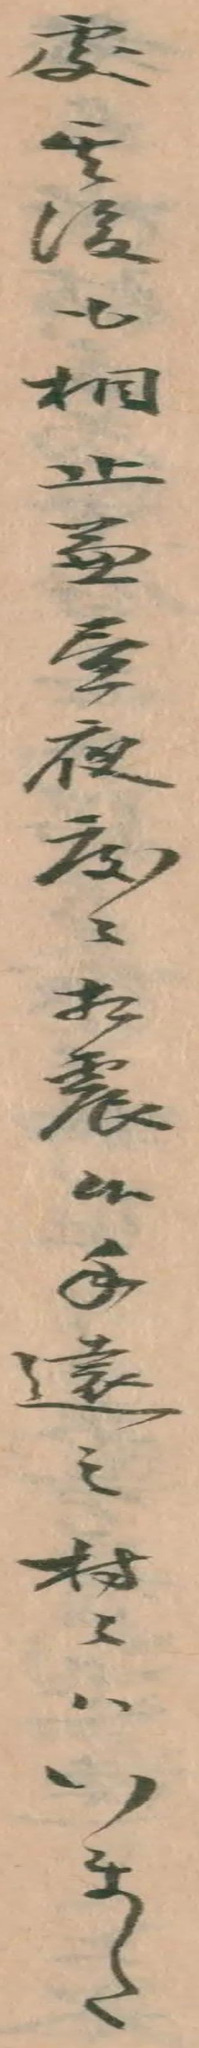処其後も相止兼昼夜度々相震候手遠之村々ハいまた
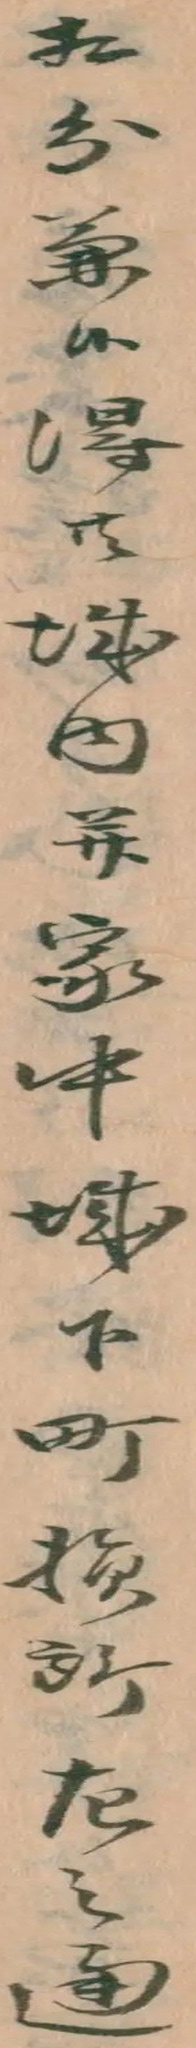相分兼候得共城内并家中城下町損所左之通
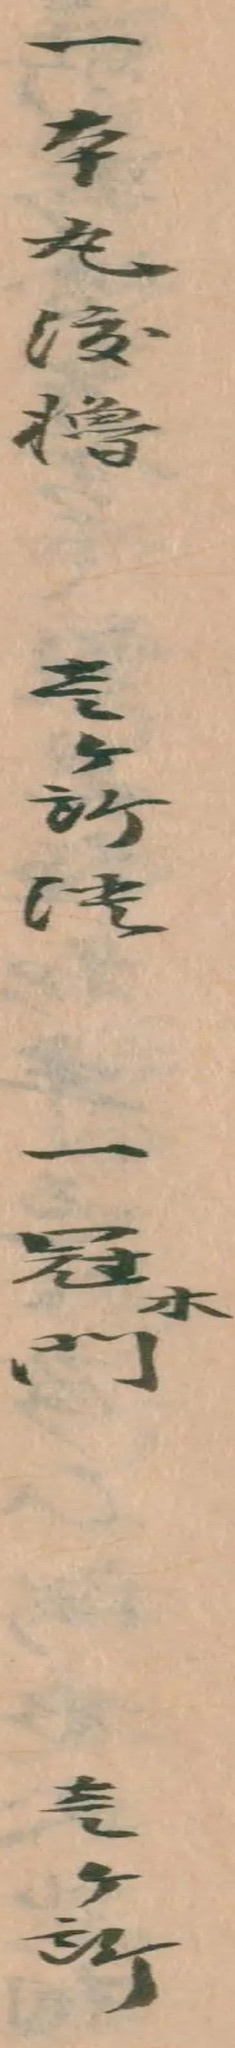一本丸渡櫓一ケ所潰一冠木門壱ヶ所
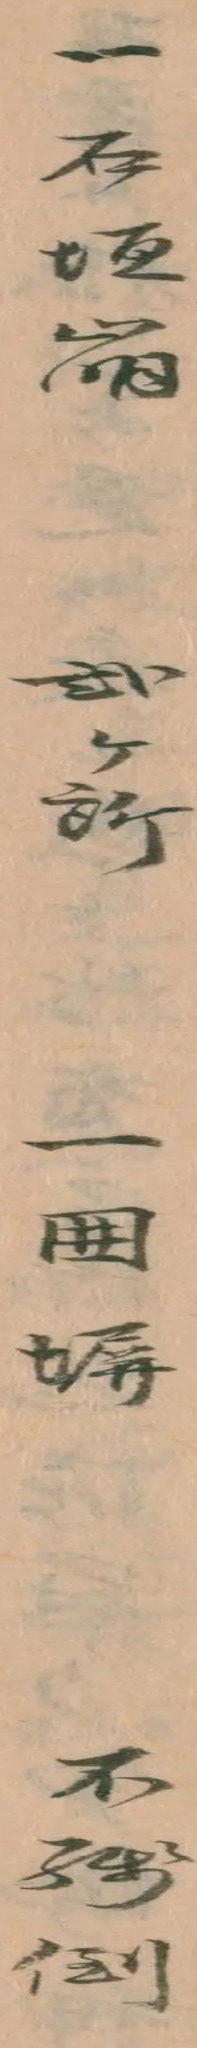一石垣崩弐ヶ所一囲塀不残倒
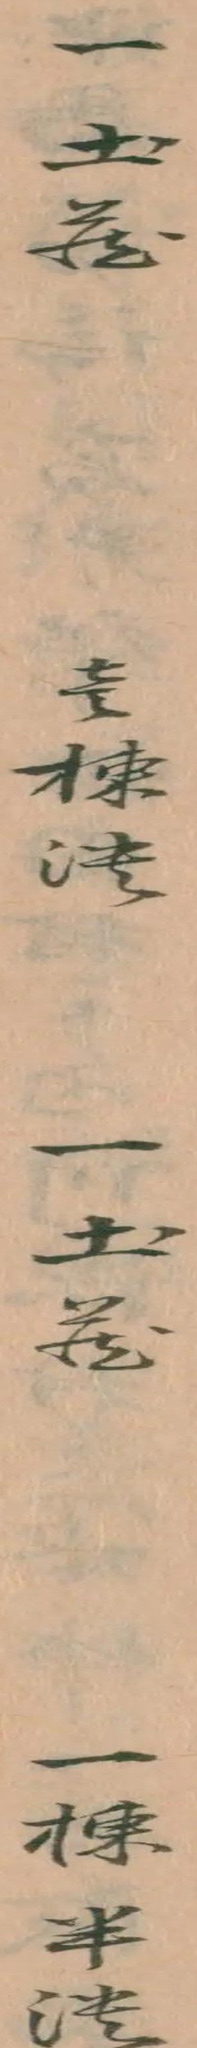一土蔵壱棟潰一土蔵一棟半潰
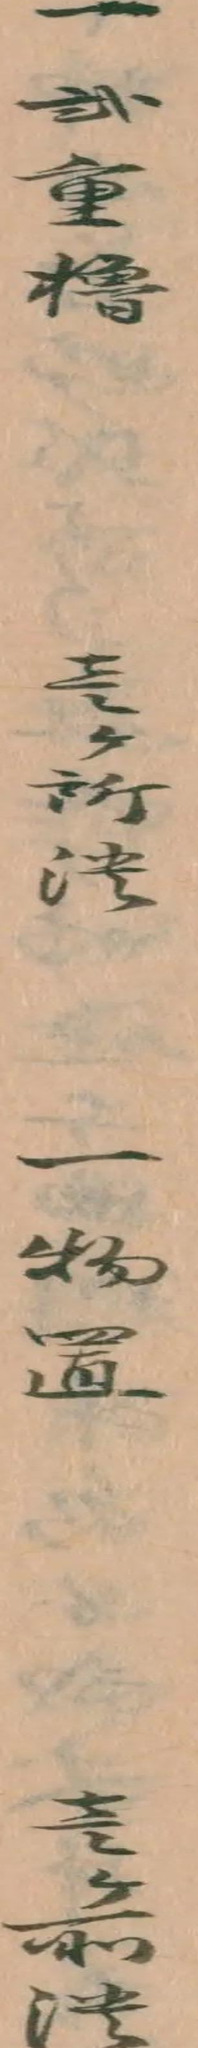一弐重櫓壱ヶ所潰一物置壱ヶ所潰
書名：地災撮要. 巻3(地震之部)-巻4(噴火之部)
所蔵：国立国会図書館 National Diet Library, JAPAN
